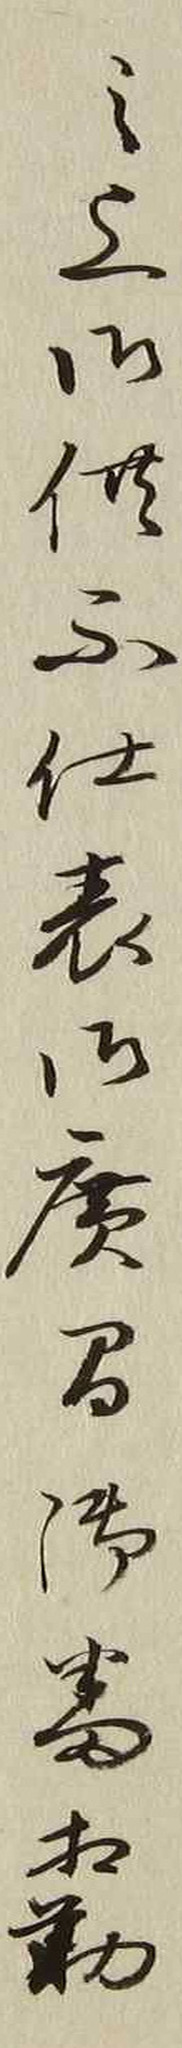之上御供不仕表御広間御番相勤
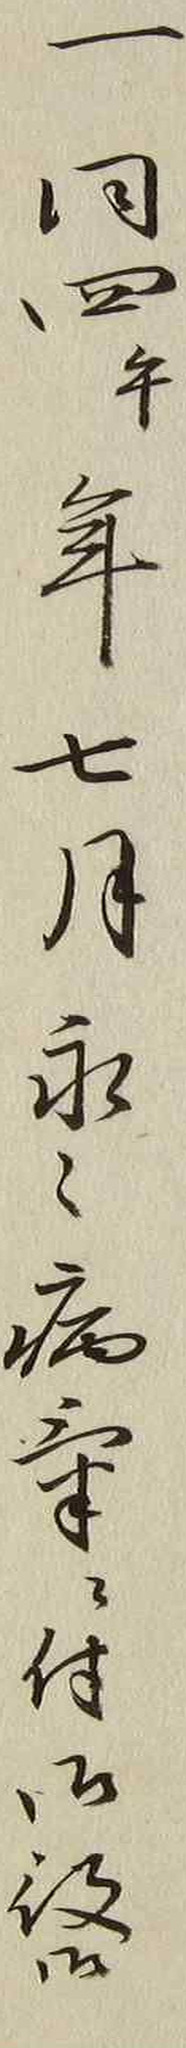一同四午年七月永々病気ニ付御役御
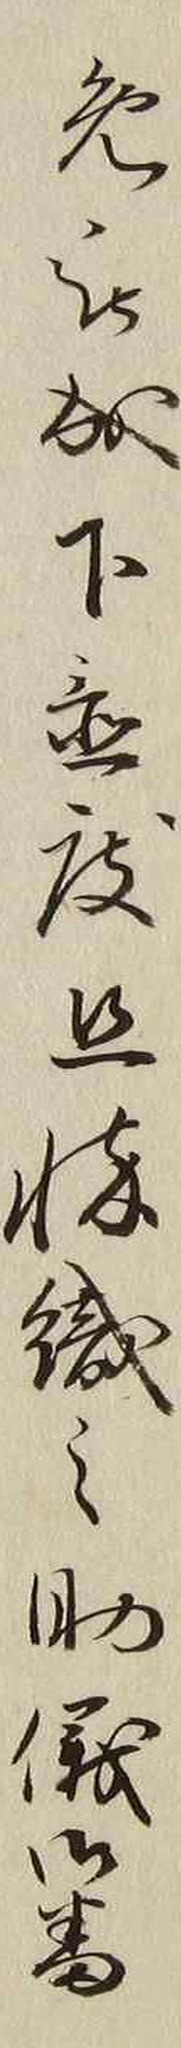免被成下置度且倅織之助儀御番
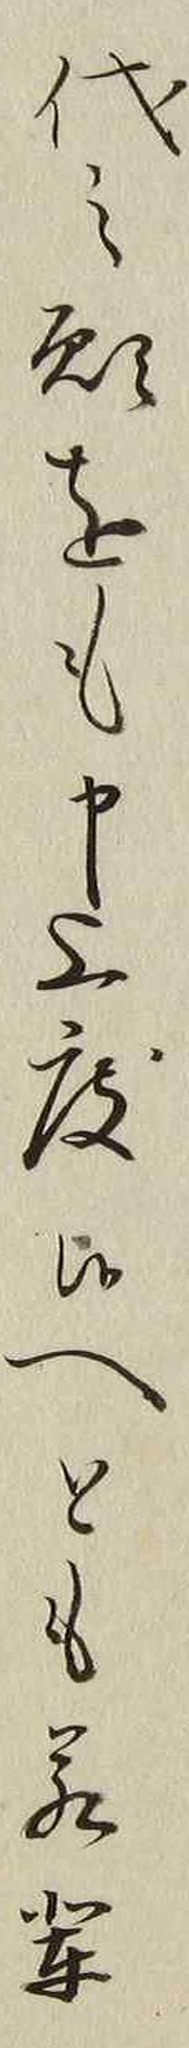代之願をも申上度候へとも若輩
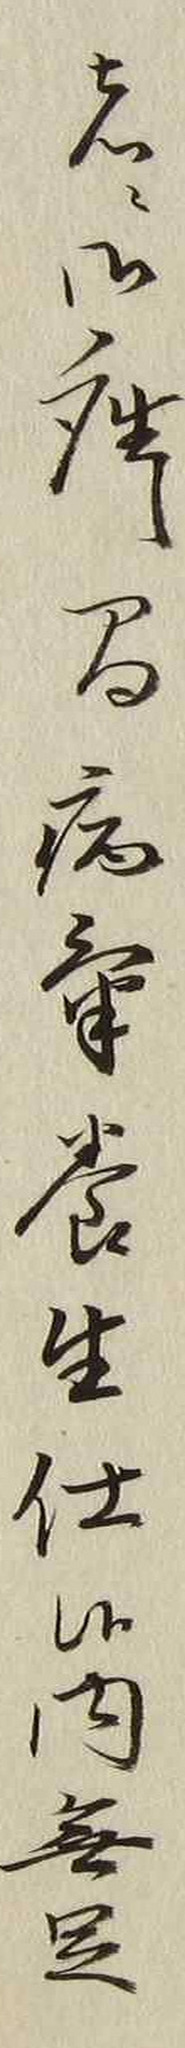者ニ御座候間病気養生仕候内無足
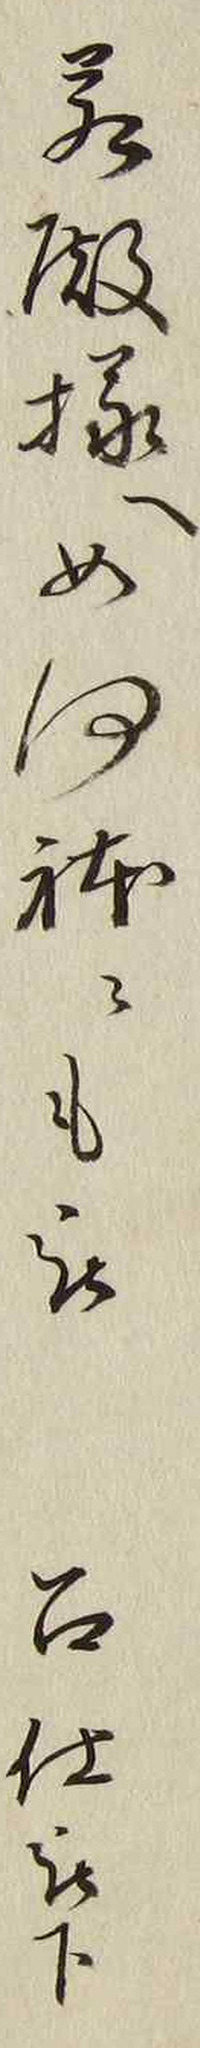若殿様へ如何体ニも被召仕被下
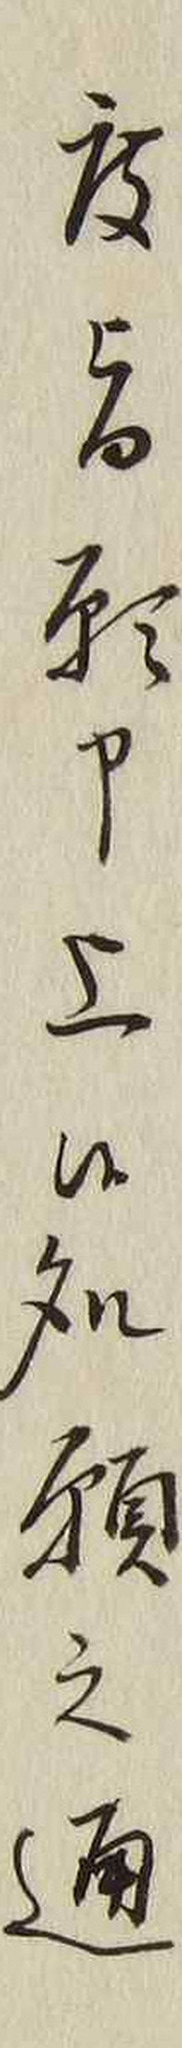度旨願申上候処願之通
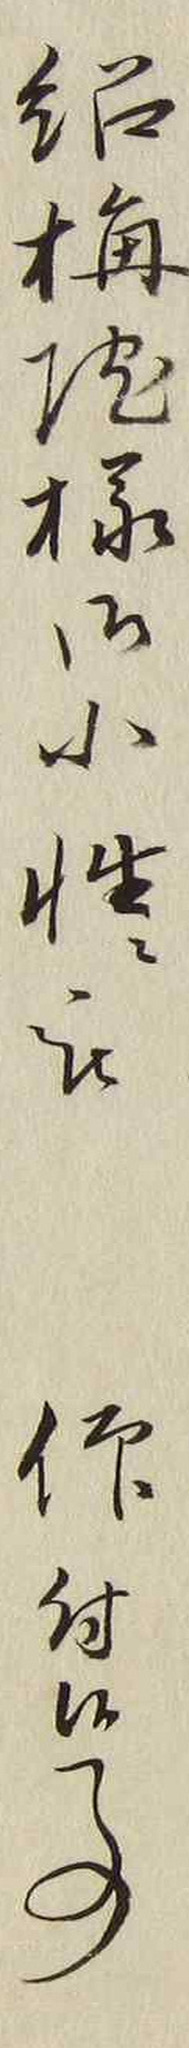紹栴院様御小性ニ被仰付候事

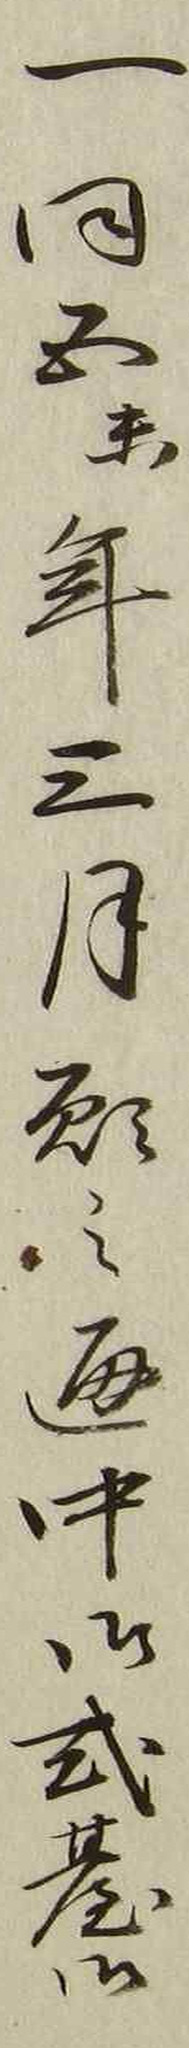一同五未年三月願之通中御式台御
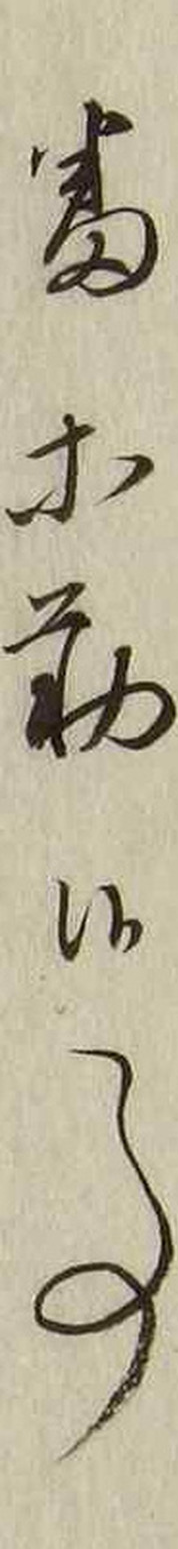番等勤候事
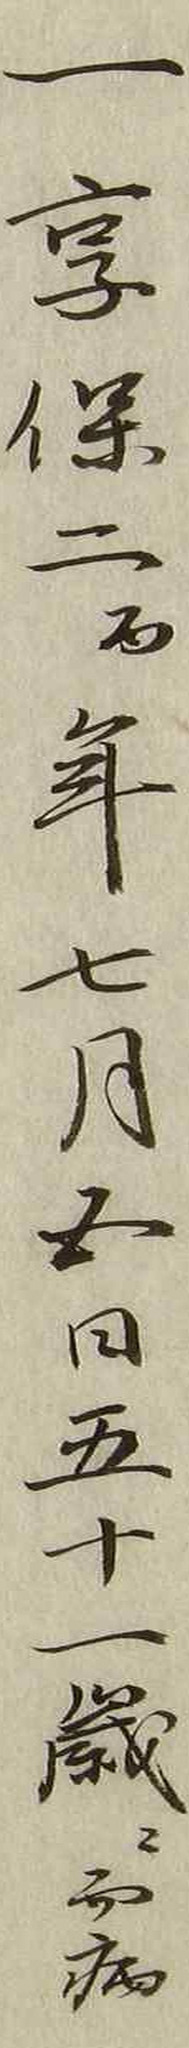一享保二酉年七月五日五十一歳ニ而病
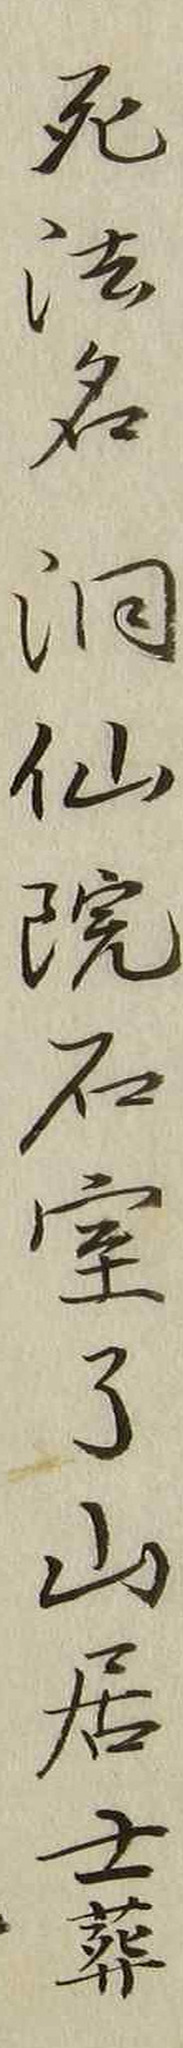死法名洞院石室了山居士葬
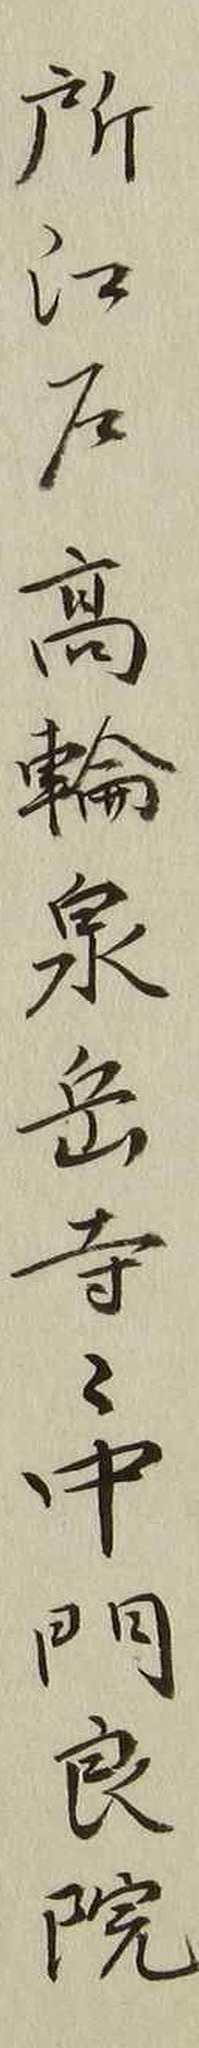所江戸高輪泉岳寺々中門良院
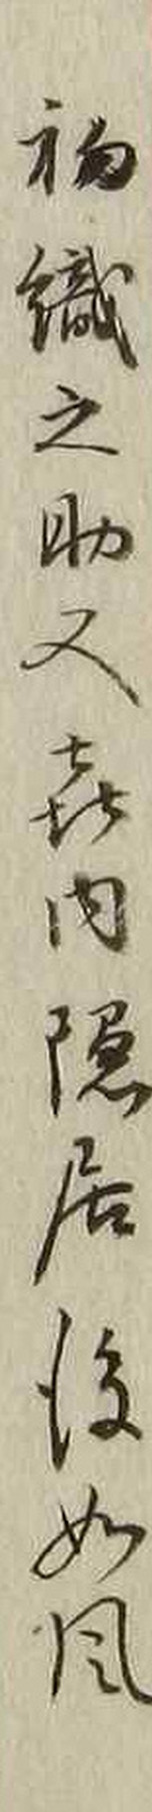初織之助又喜内隠居後如風
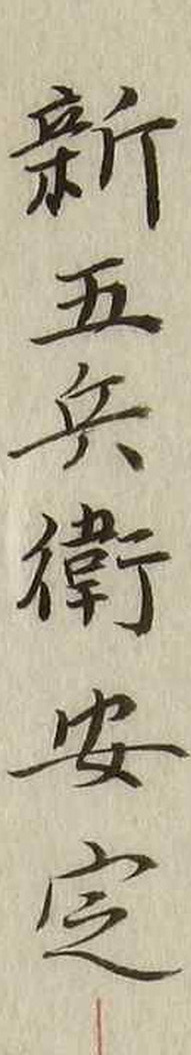新五兵衛安定
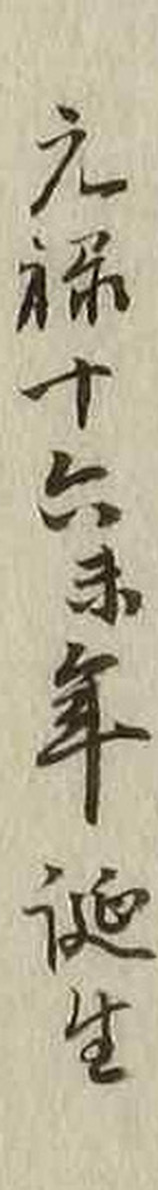元禄十六未年誕生
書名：諸士系譜　巻之19　い之部19
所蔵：会津若松市立会津図書館
